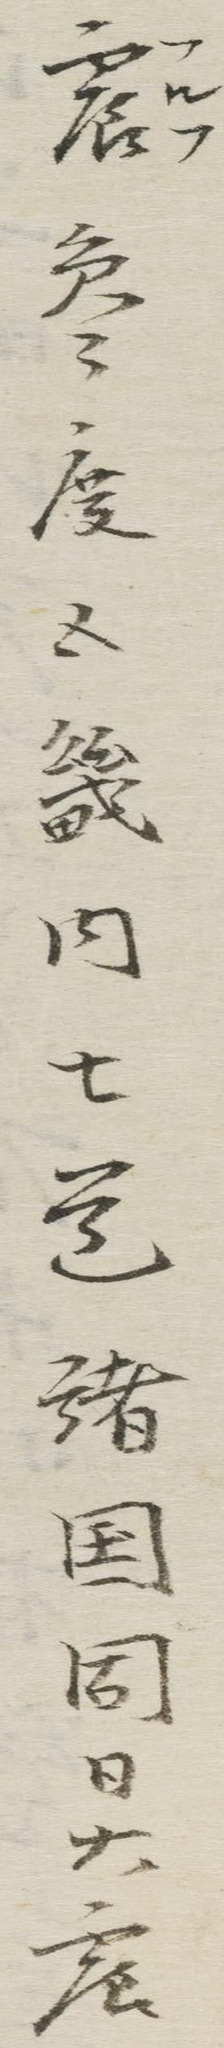震参度五畿内七道諸国同日大震
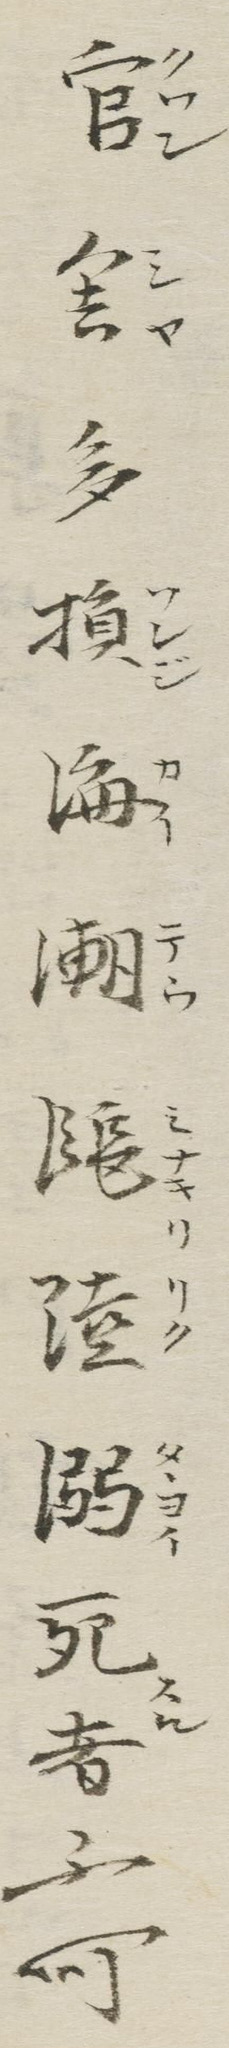官舎多損海潮漲陸溺死スル者不可
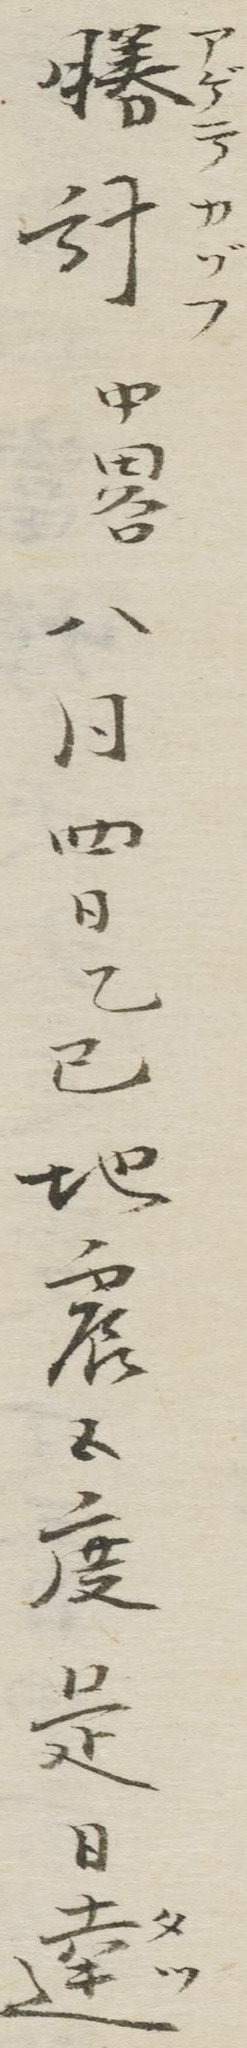勝計中略八月四日乙巳地震五度是日達
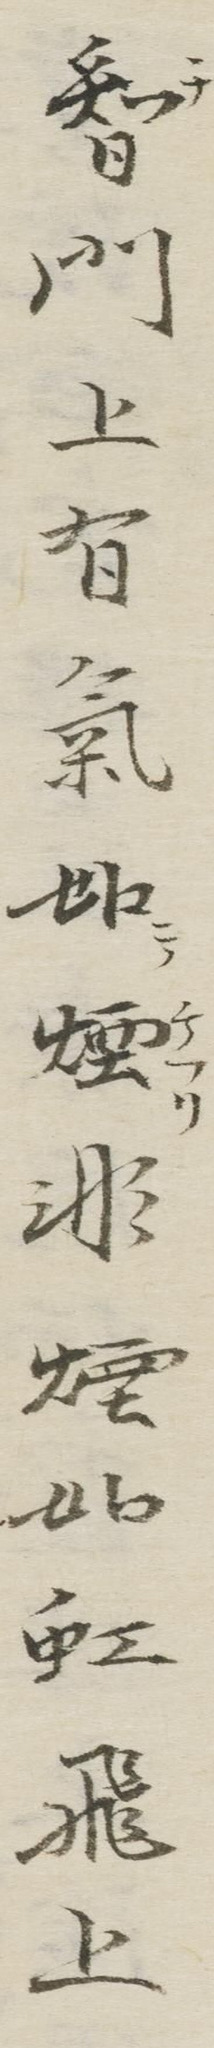智門上有気如煙非烟如虹飛上

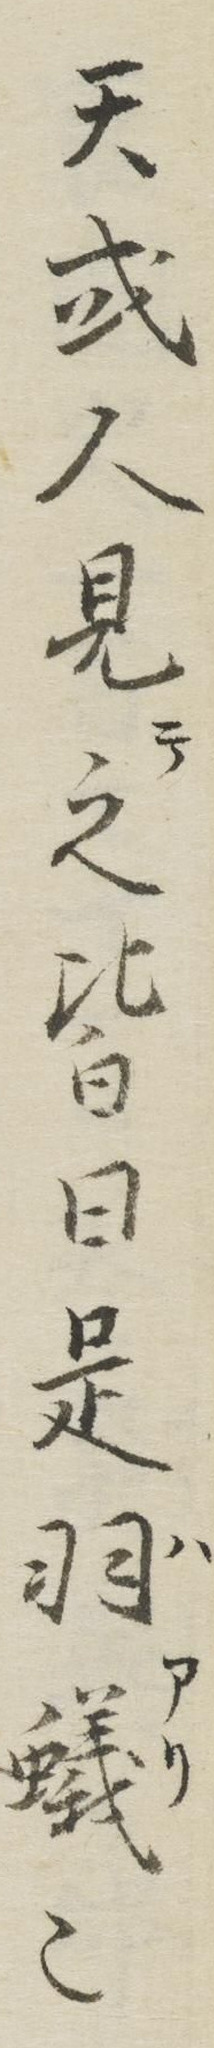天或人見之皆曰是羽蟻也
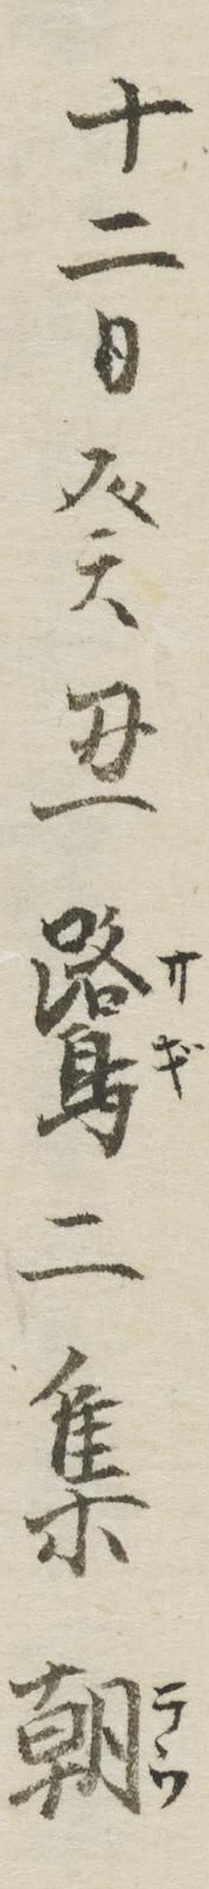十二日癸丑鷺二集朝
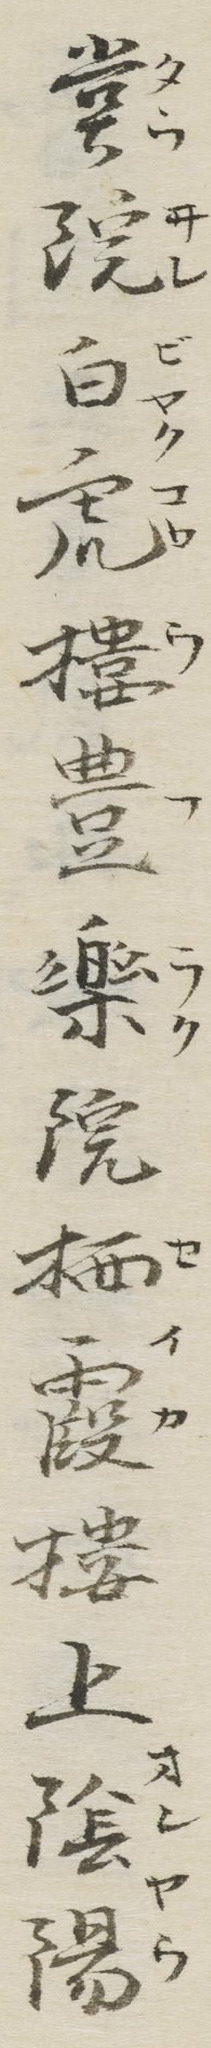堂院白虎樓豊樂院栖霞樓上陰陽
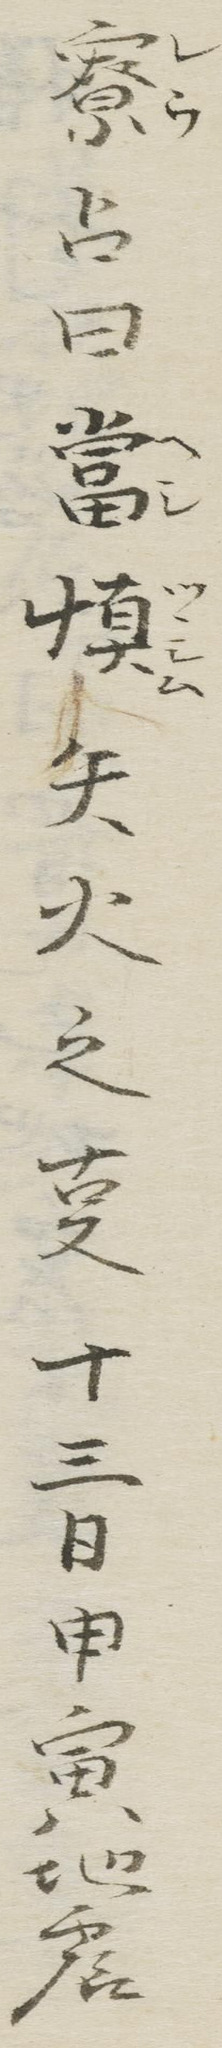寮占曰當慎失火之事十三日申寅地震
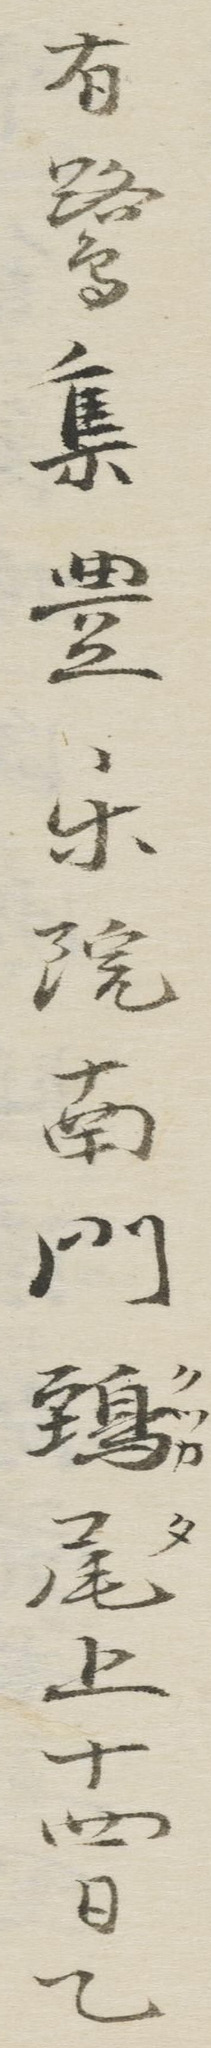有鷺集豊楽院南門鵄尾上十四日乙
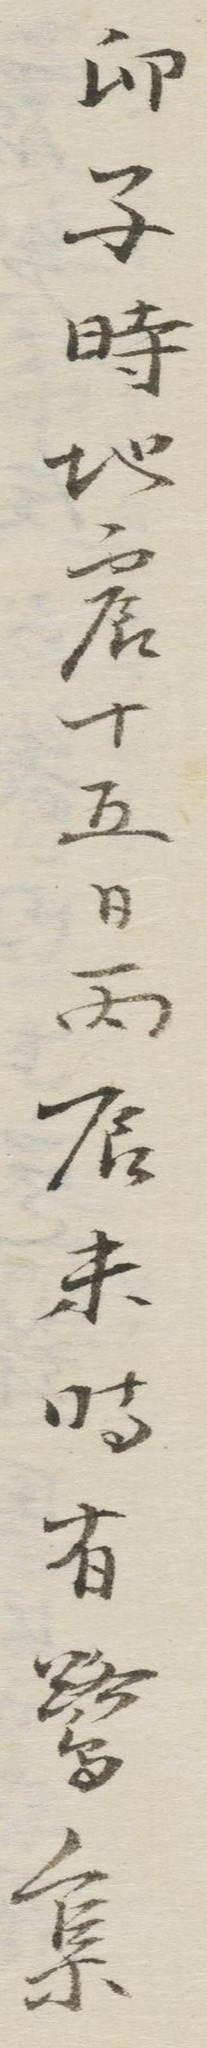卯時地震十五日丙辰未時有鷺集
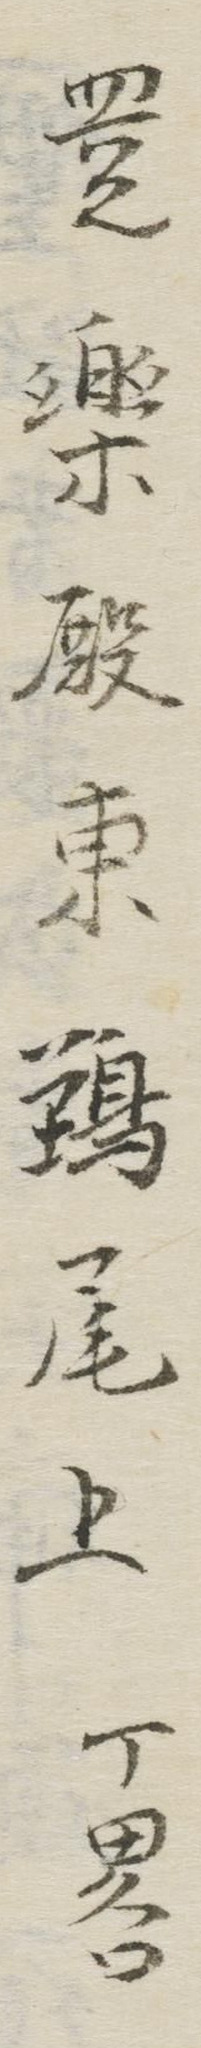豊樂殿東鵄尾上丁略
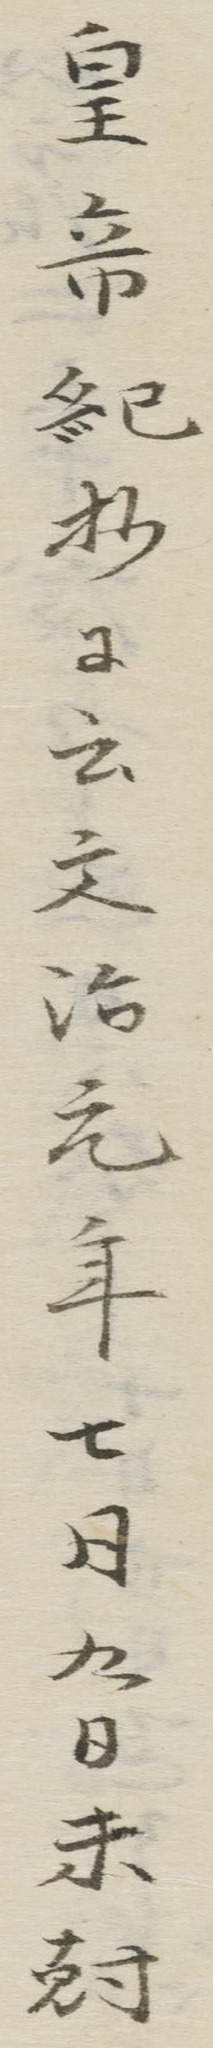皇帝紀抄に云文治元年七月九日未尅
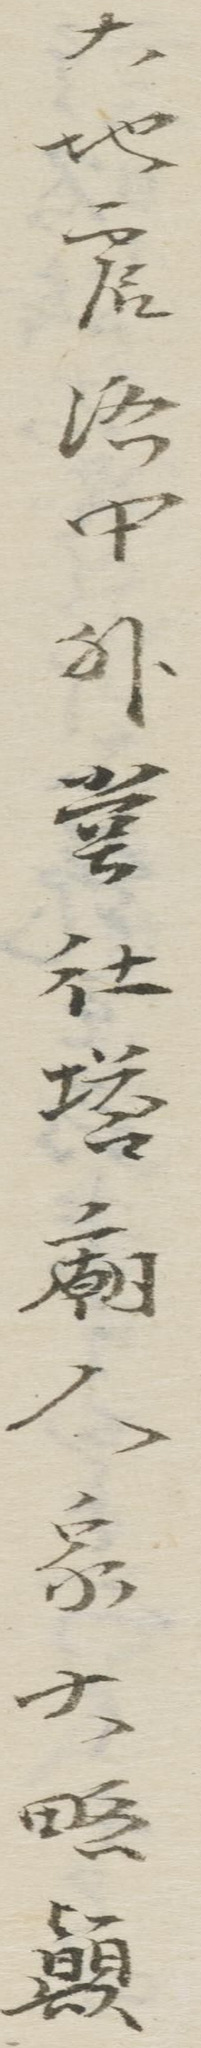大地震洛中外堂社塔廟人家大略顛
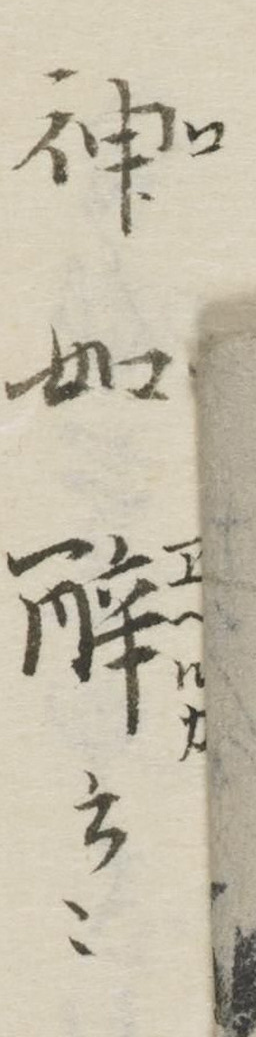神如酔云々
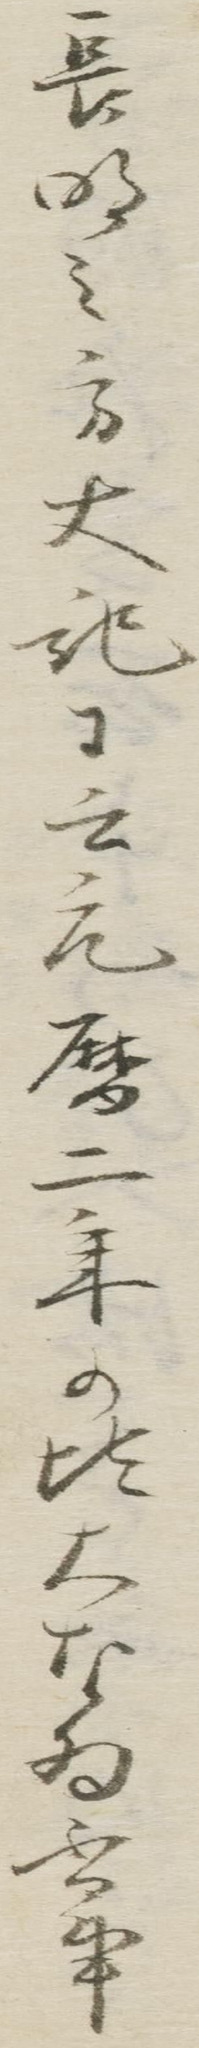長明之方丈記二云元暦二年の頃大なゐふる事
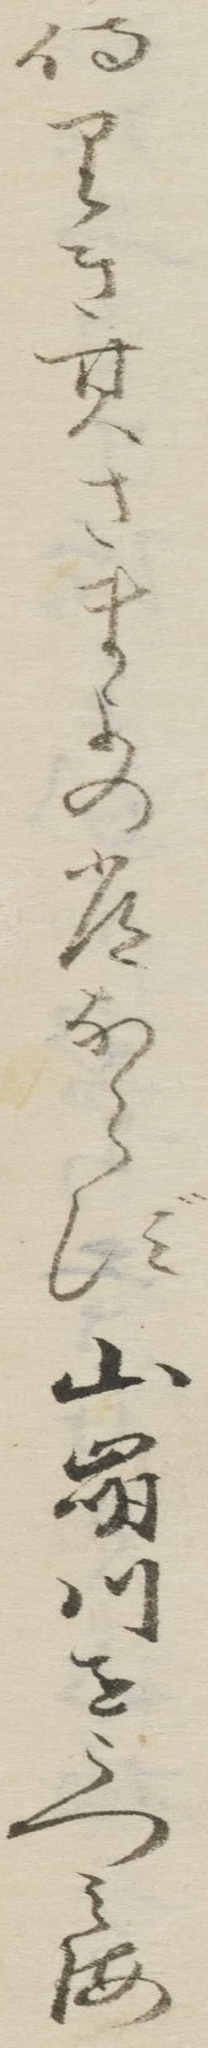備りき其さまよの常ならず山崩川をうつミ海
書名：諸国大地震大津波一代記
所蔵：東京大学地震研究所図書室 Earthquake Research Institute Library, The University of Tokyo, JAPAN
